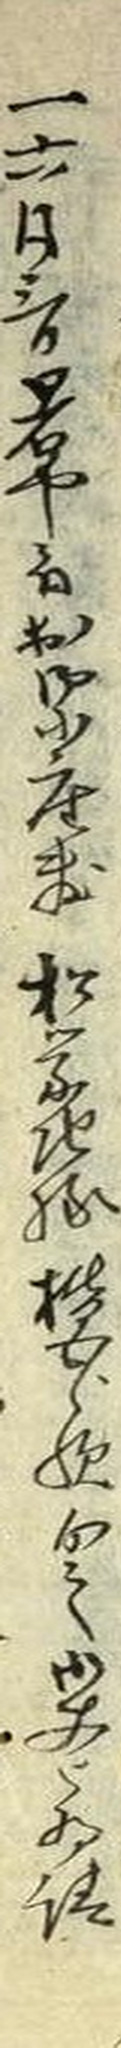一六月三日暑中ニ付於御小座敷松栄院様楷五郎様ゟ之御使被為請
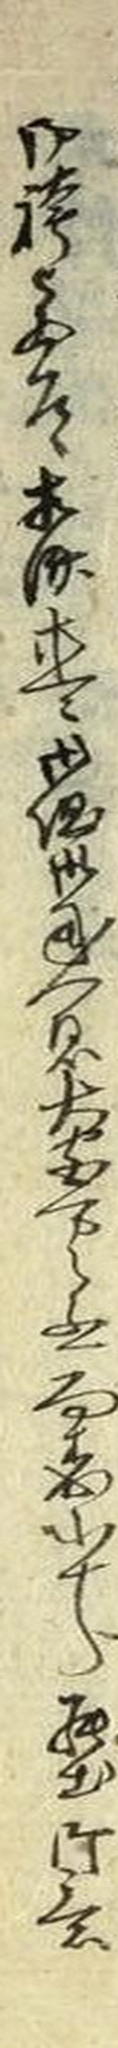御袴被為召候相済直々御側御用人息大宮万之丞雨森小十郎罷出御意
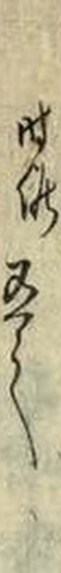時候有之
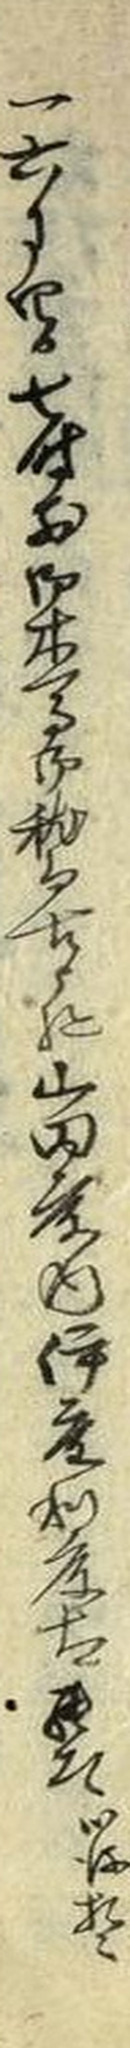一六月四日七時前御木馬御稽古被遊山田藤内伊藤利藤太罷出候以後折々
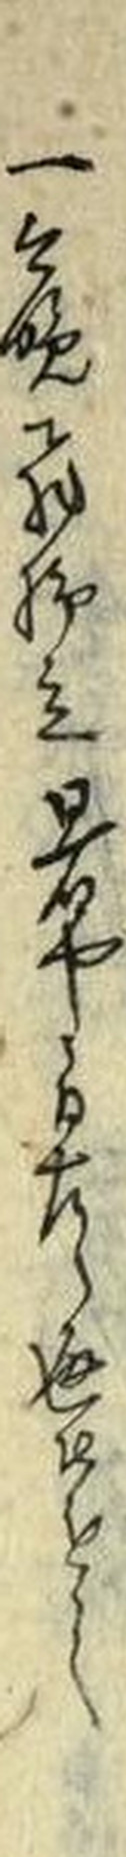一今晩飛脚立暑中ニ付左之通被進之

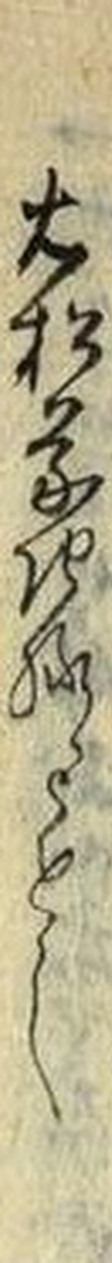右松栄院様へ被進之
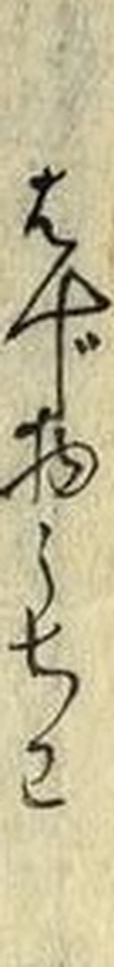はんじ物うちわ
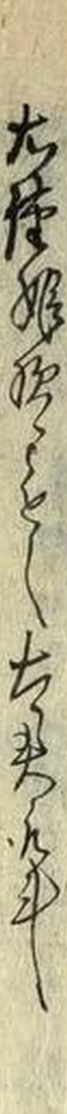右謹姫様被進之大奥取斗
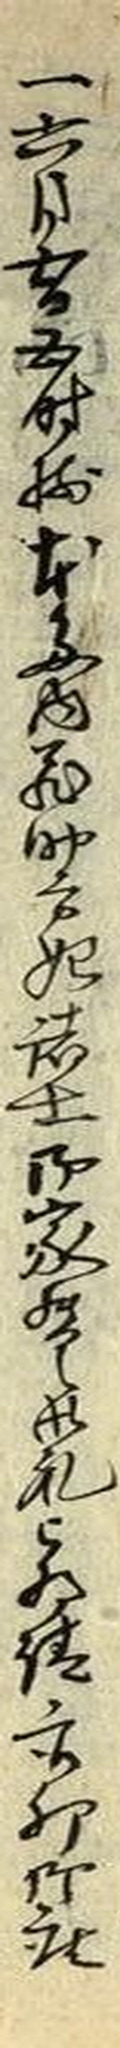一六月五日五時揃本多内蔵助方始諸士御家督之御礼被為請最初御座
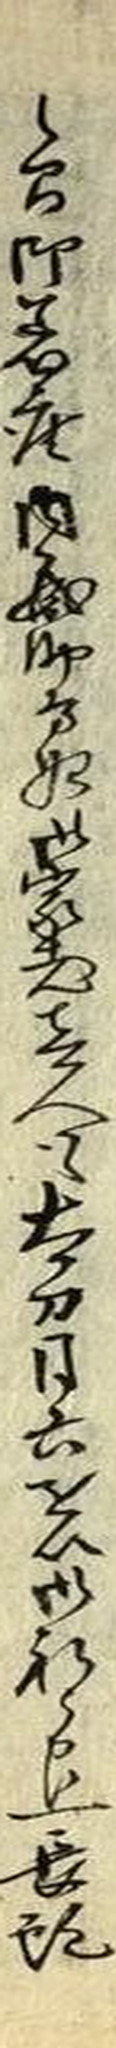之間御着座内蔵助方始御家老壱人ツヽ太刀目六を以御礼被申上長鮑
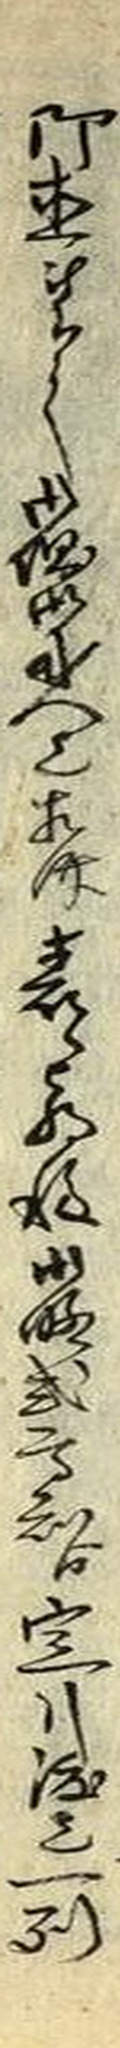御直被下之御側御用人迄相済表へ被為移御略式高知ゟ定引渡迄一列
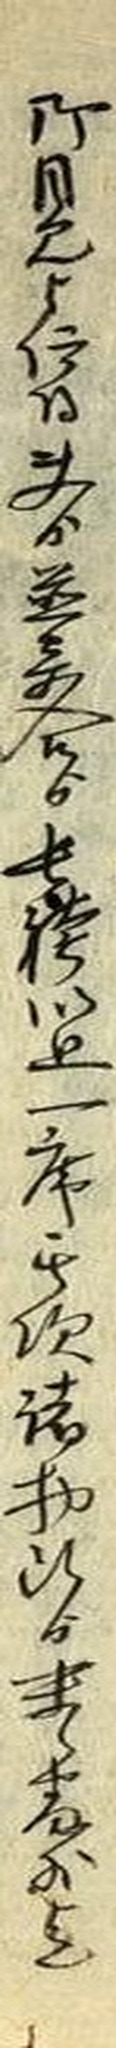御目見被仰付夫ゟ並寄合ゟ長袴以上一席其次諸物頭ゟ未々番外迄
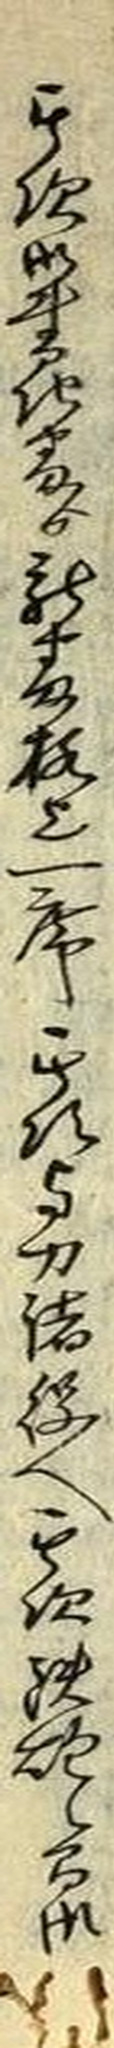其次御書院番ゟ新番格迄一席其次与力諸役人其次鉄炮之間御
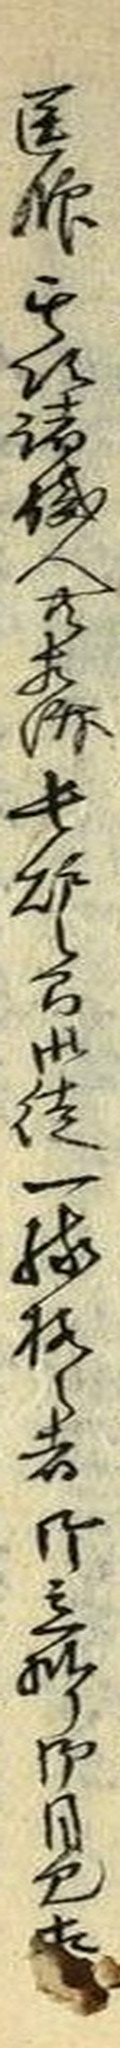医師其次諸職人共相済長炉之間御徒一統格之者御立掛り御目見相
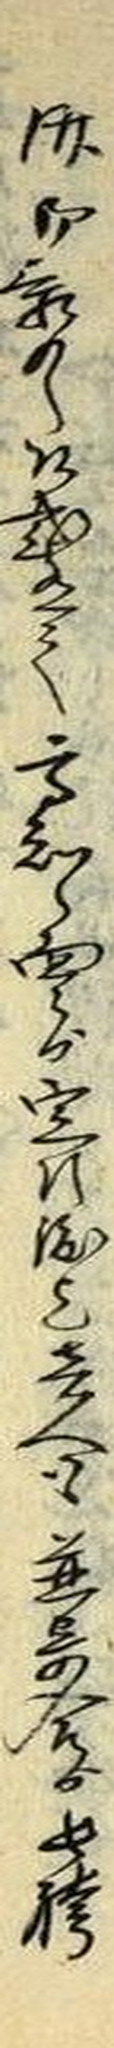済御影のし頂戴有之高知之面々ゟ定引渡迄壱人ツヽ並寄合ゟ長袴
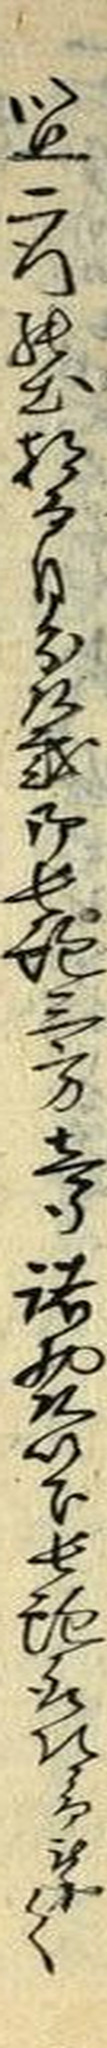以上二行罷出都而自分頂戴御長鮑三方壱ツ諸物頭以下長鮑取次ニ而被頂之
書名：少傅日録抄（斉善付側向頭取日記、江戸并道中、初入在国、逝去後…
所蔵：福井県文書館 Fukui Prefectural Archives
